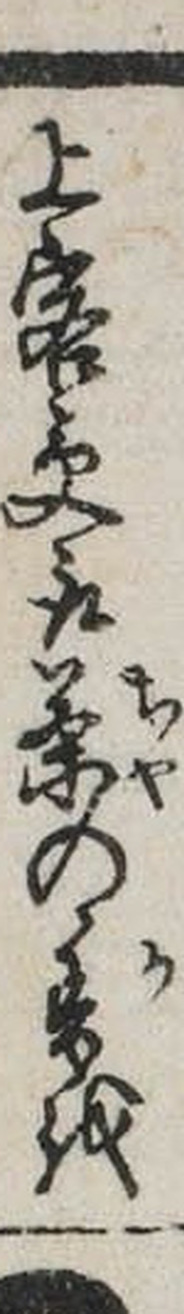上客受取茶の香を
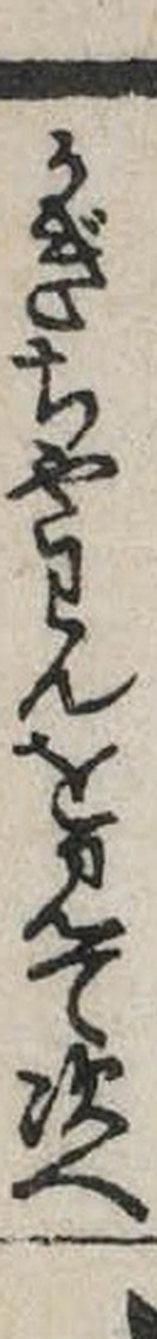かぎちやわんを見て次へ
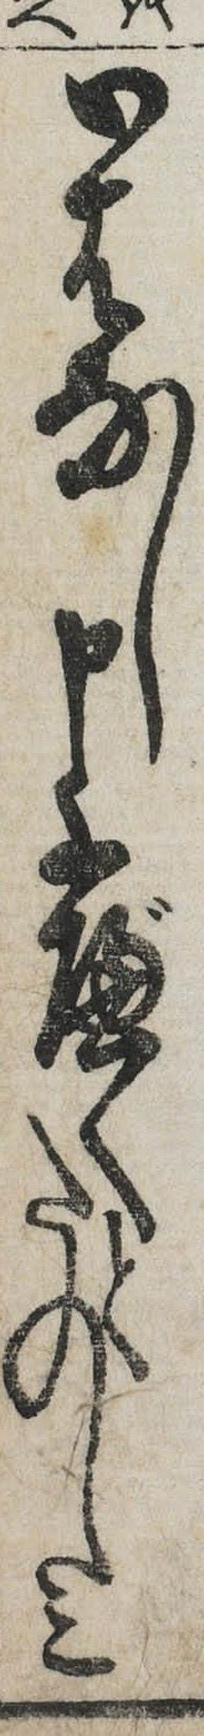御はなし申上べくとたのしみ

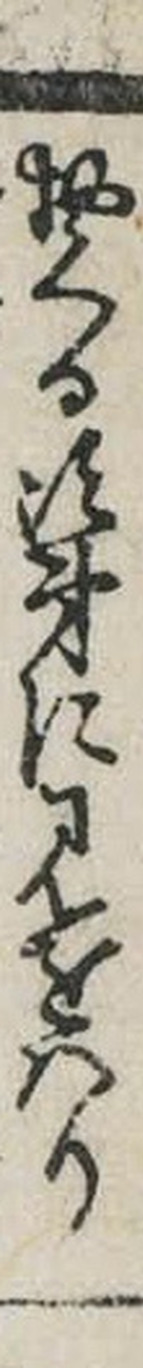おくる次第に見をはり
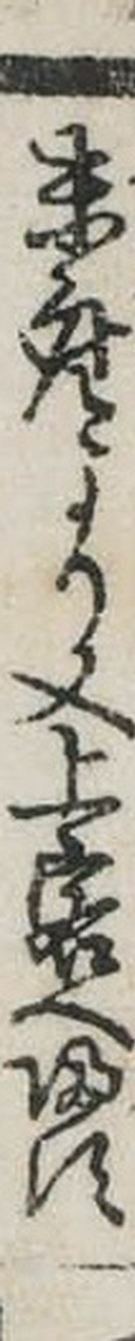末座より又上客へ帰す
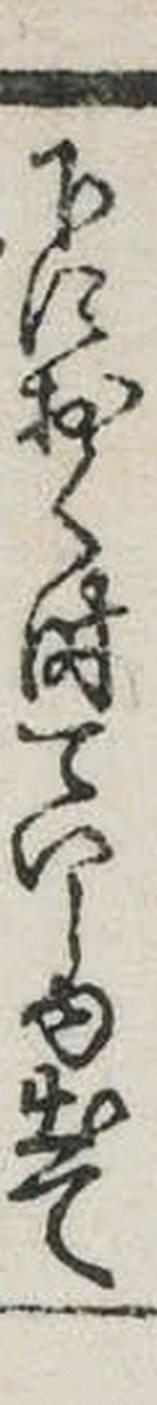下におく時ていしゆ出て
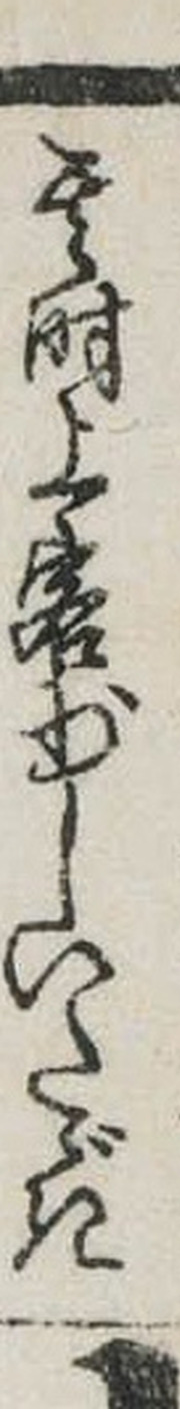其時上客少しいたゞき
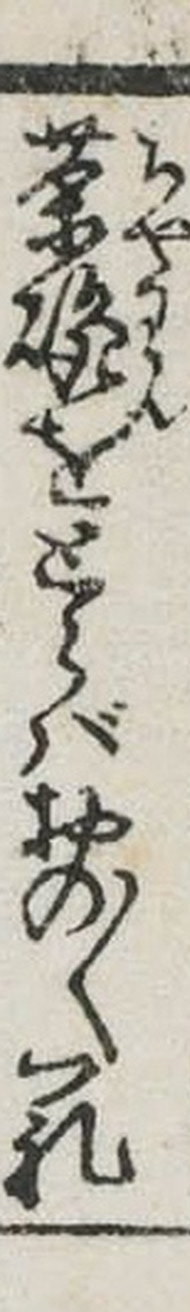茶碗をとらばおの〳〵一礼
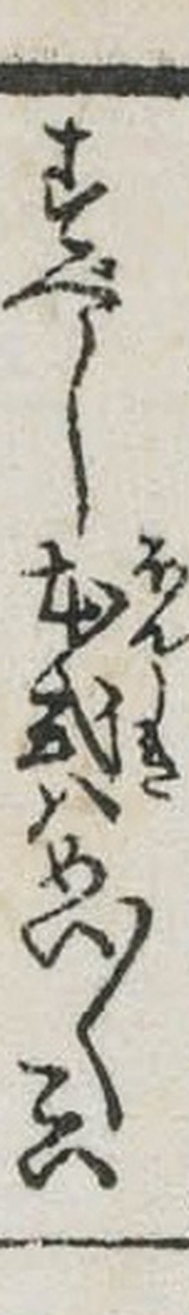すべし本式はめい〳〵こい
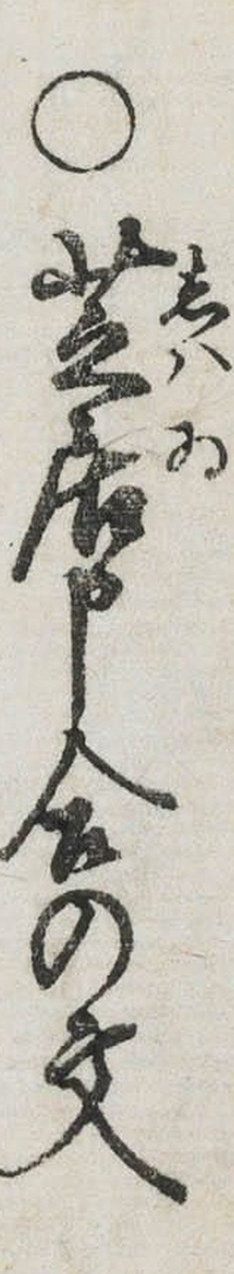○芝居申合の文
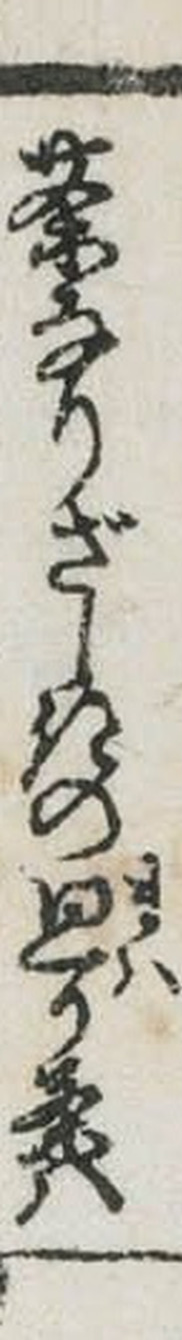茶なりざしきの廻り茶は
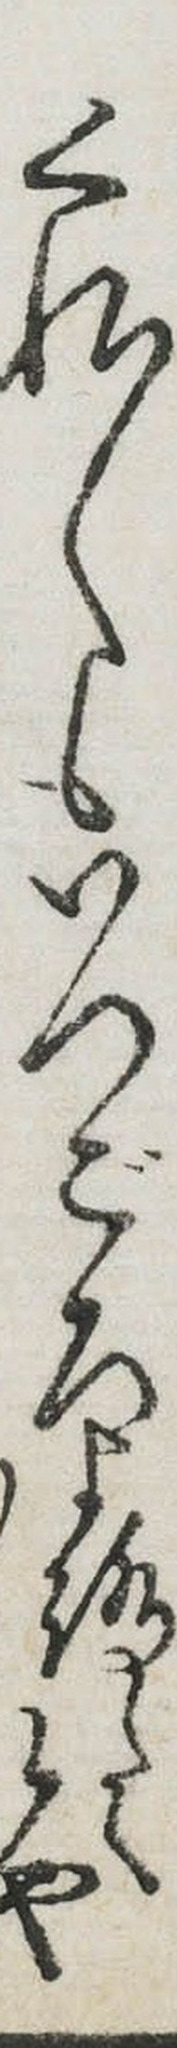くれ〳〵もいつごろよろしく候や
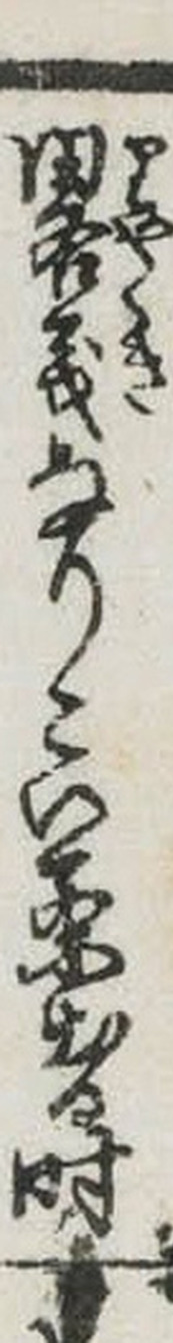略義なりこい茶出る時
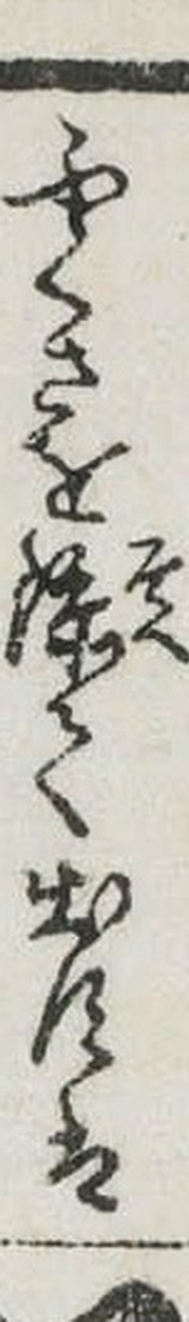ふくさを添て出すは
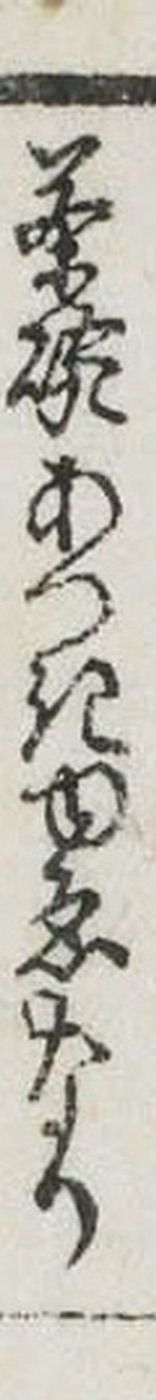茶碗あつきゆゑなり
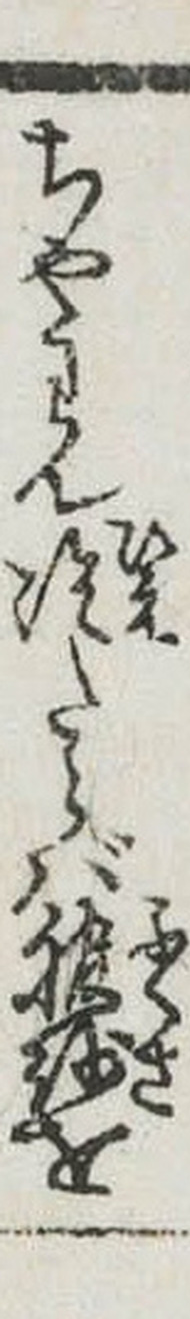ちやわん冷たらば服紗を
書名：頭書萬用婦人手紙之文言
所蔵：東京学芸大学教育コンテンツアーカイブ
